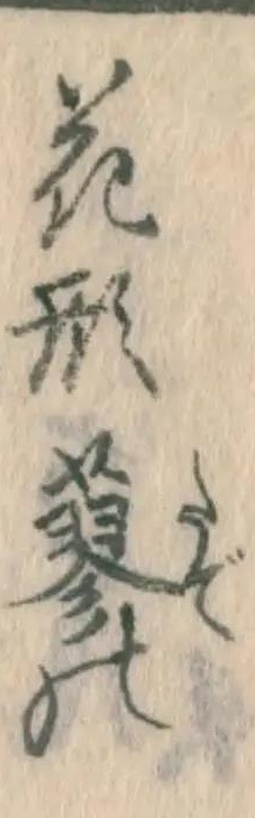花形蓼の
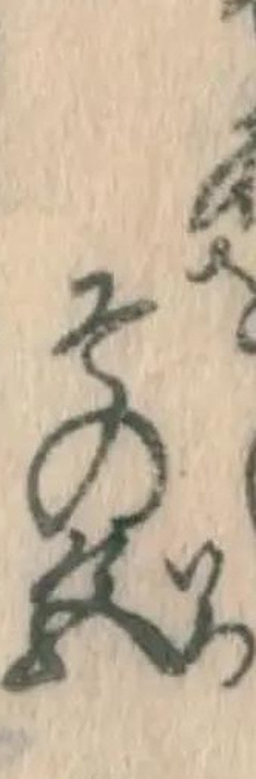その色
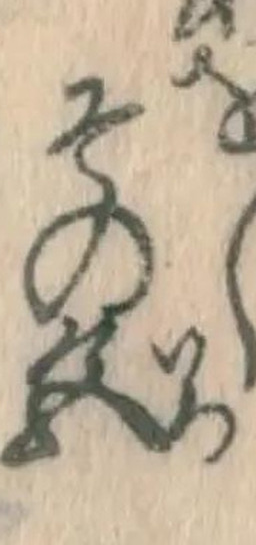その色
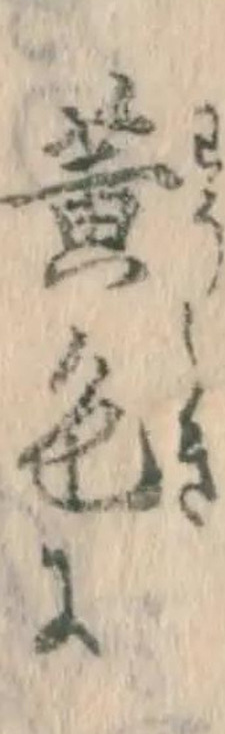黄色に
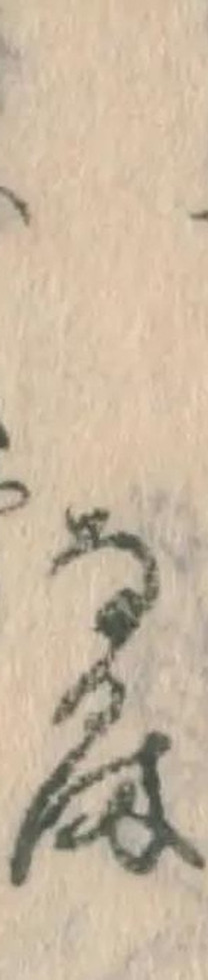なる時
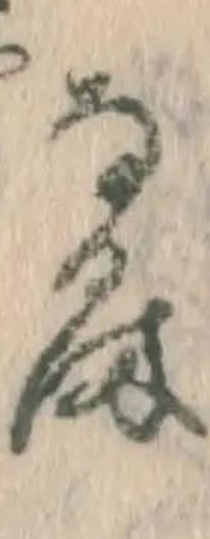なる時
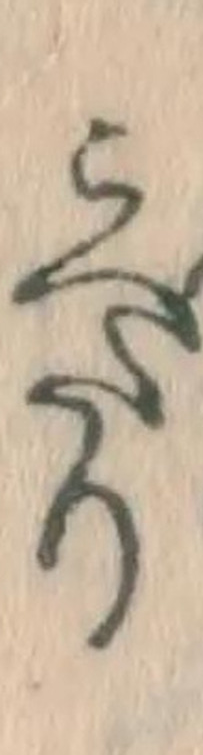こへたり
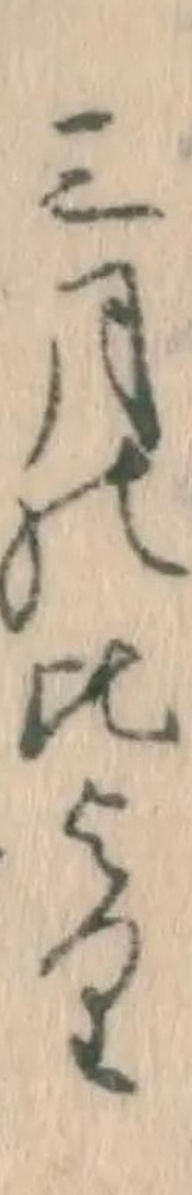三月の比より
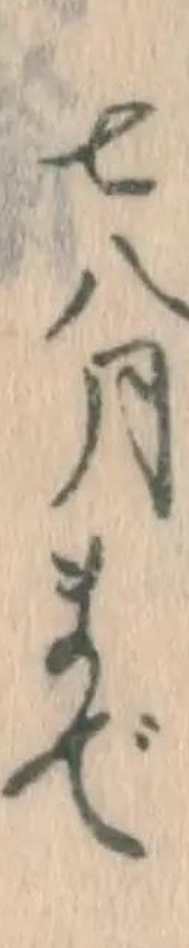七八月まで
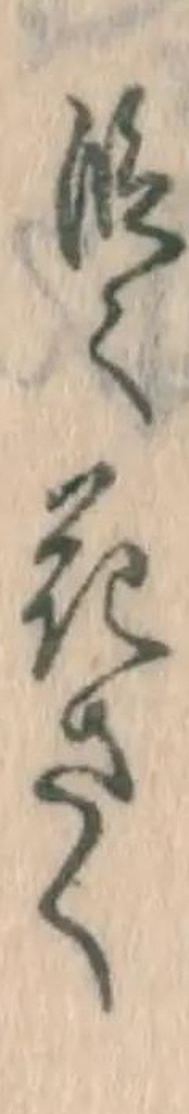段々花さく
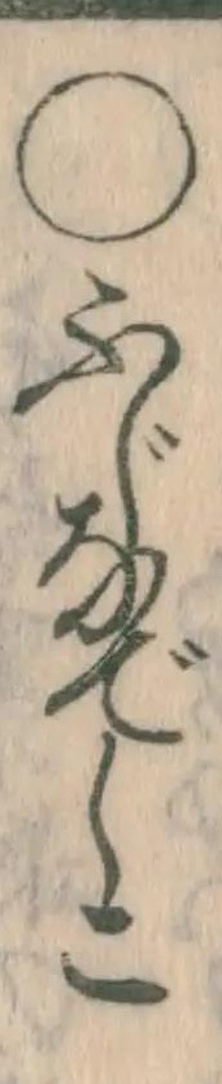〇ふじなでしこ
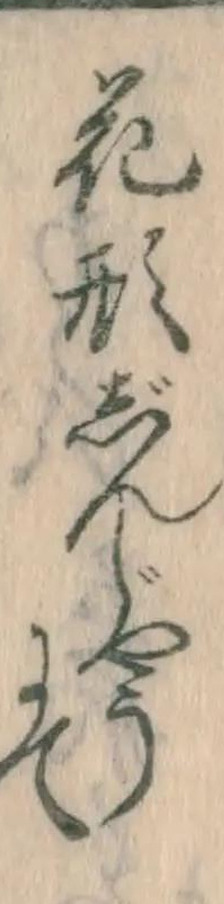花形じんじやうにて
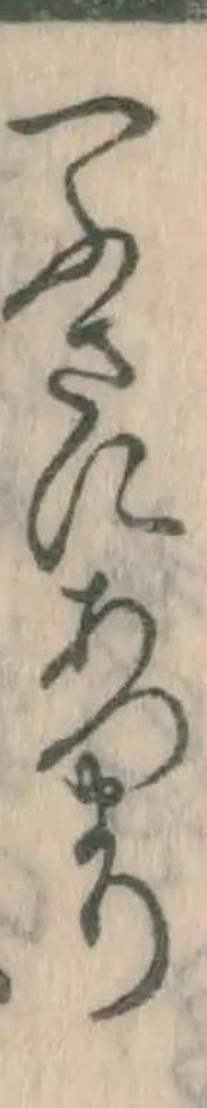一ふさにあつまり咲
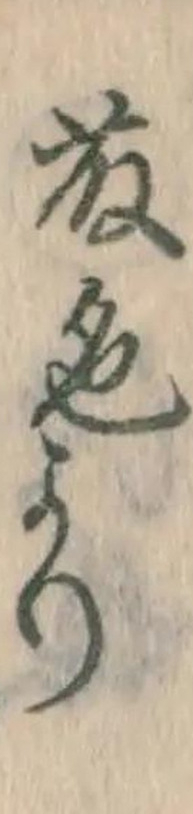藤色より
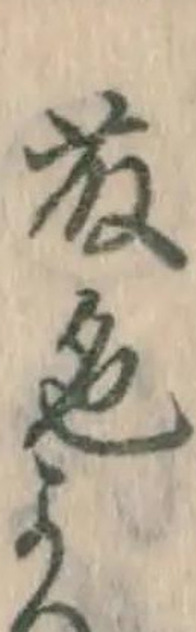藤色より
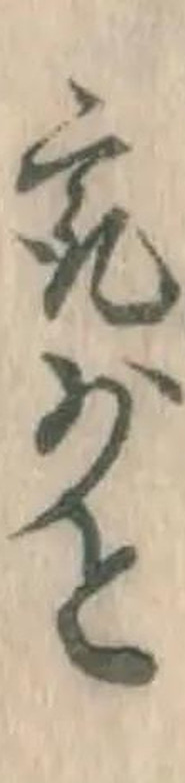最少と
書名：艸花繪前集. [3]
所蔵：国立国会図書館 National Diet Library, JAPAN
